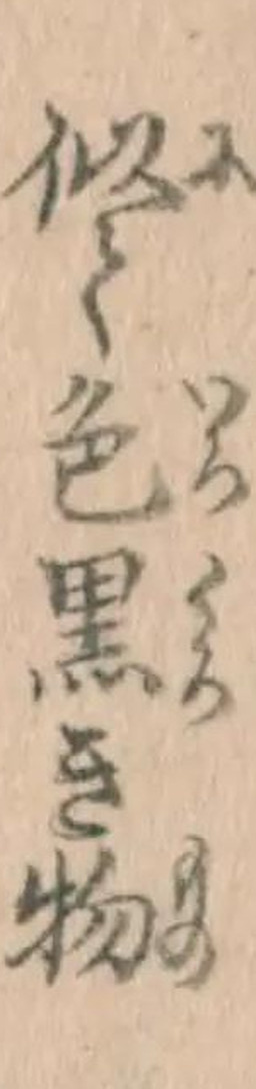似て色黒き物
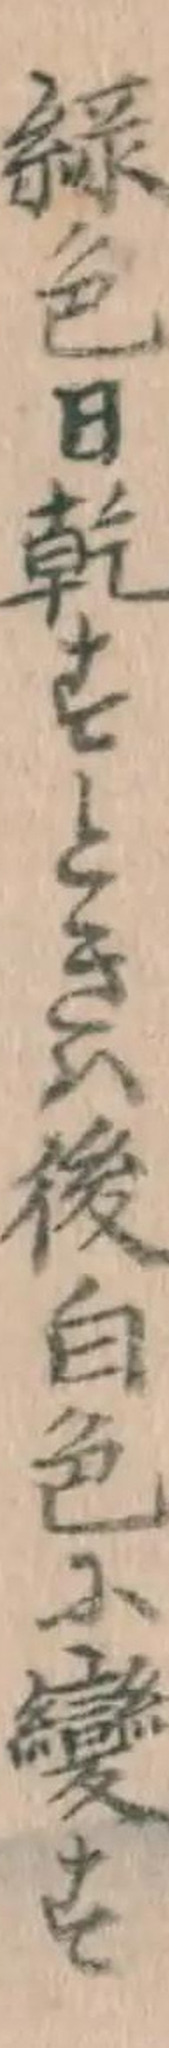緑色日乾すときは後白色に変す

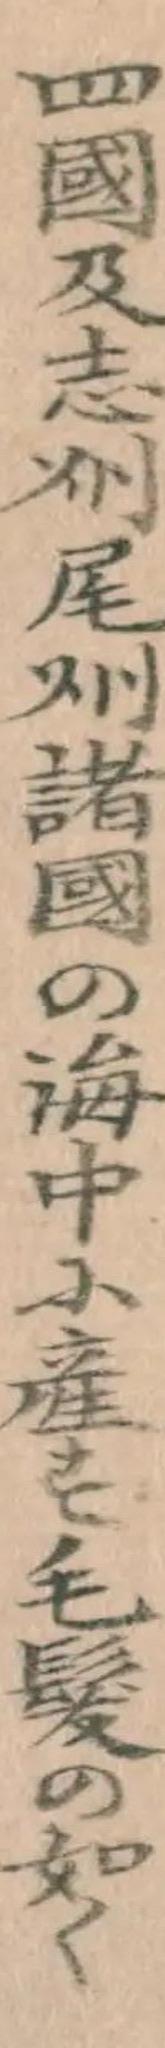四国及志州尾州諸国の海中に産す毛髪の如く
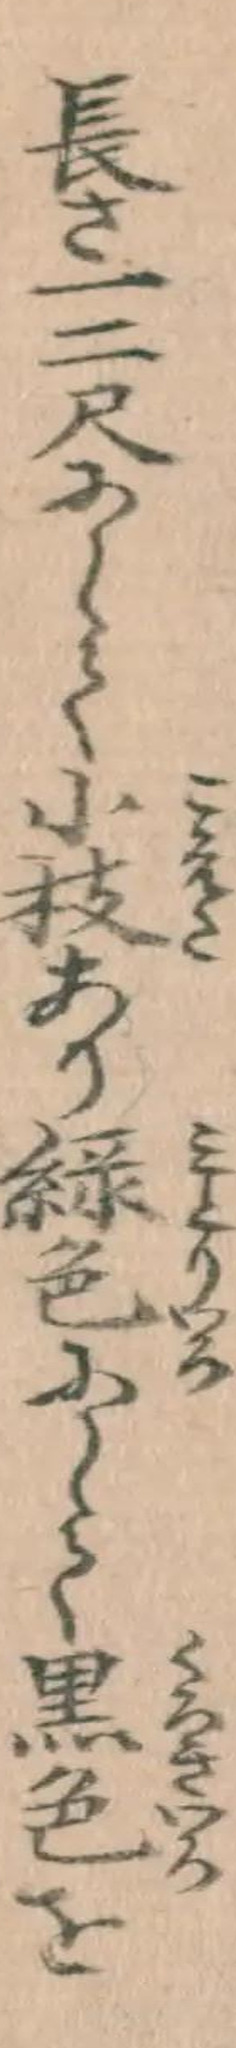長さ一二尺にして小枝あり緑色にして黒色を
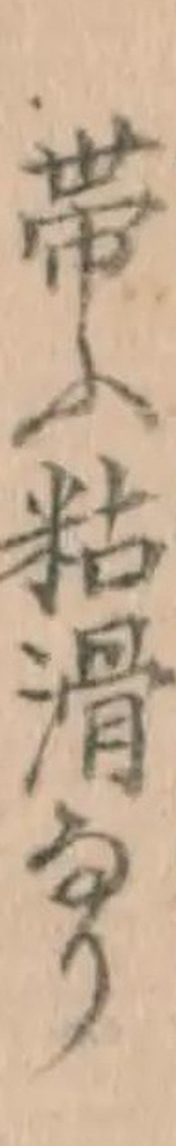帯ふ粘滑なり
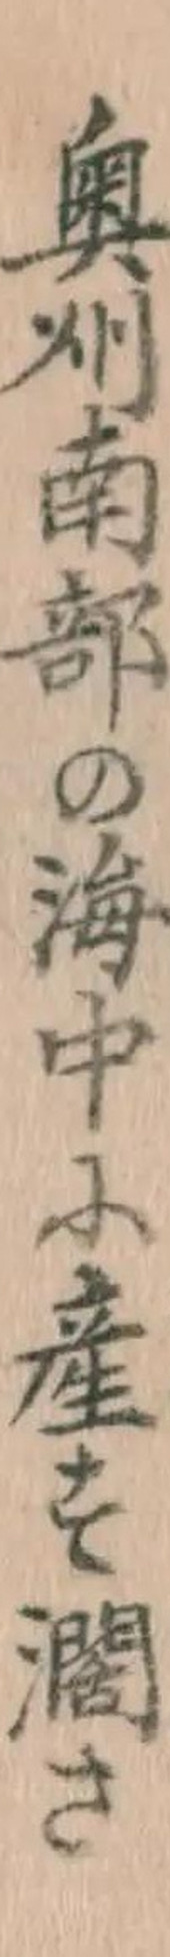奥州南部の海中に産す闊さ
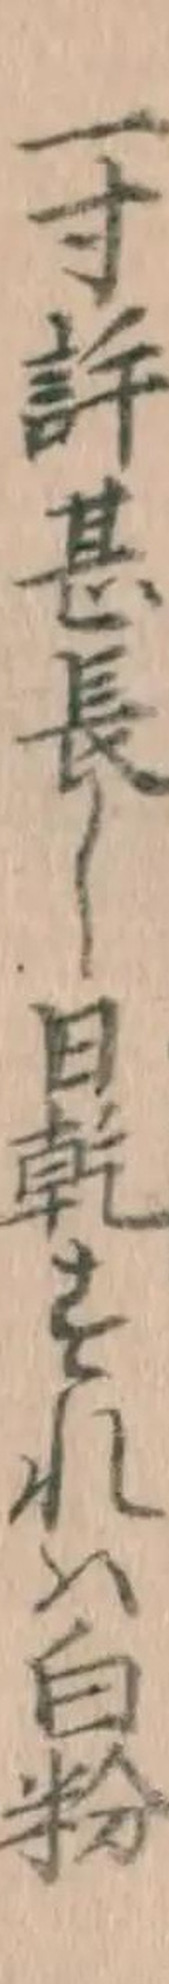一寸許甚長し日乾すれは白粉
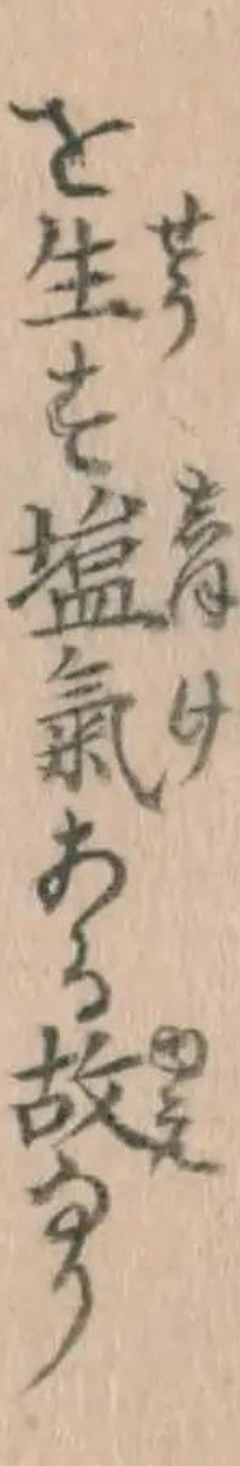を生す塩気ある故なり

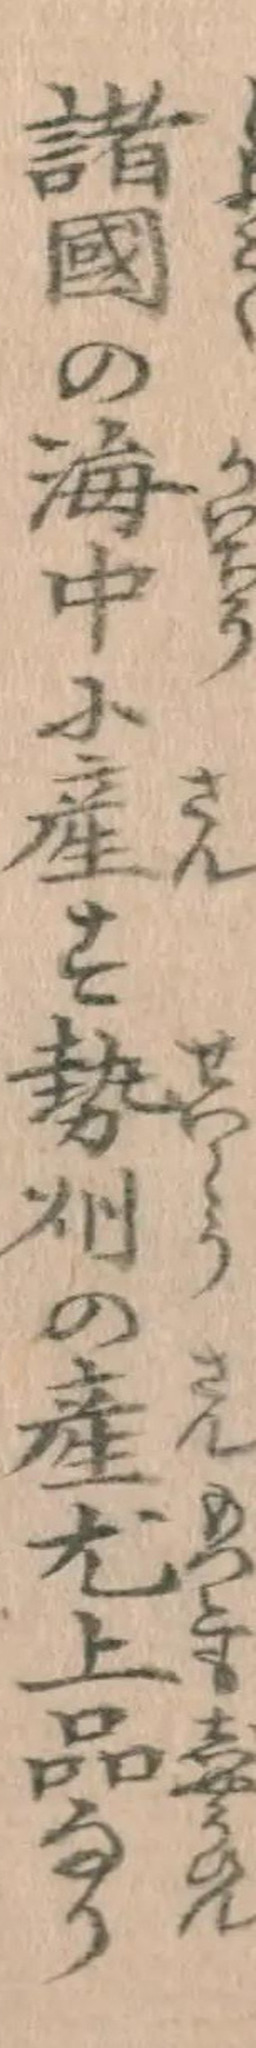諸国の海中に産す勢州の産尤上品なり
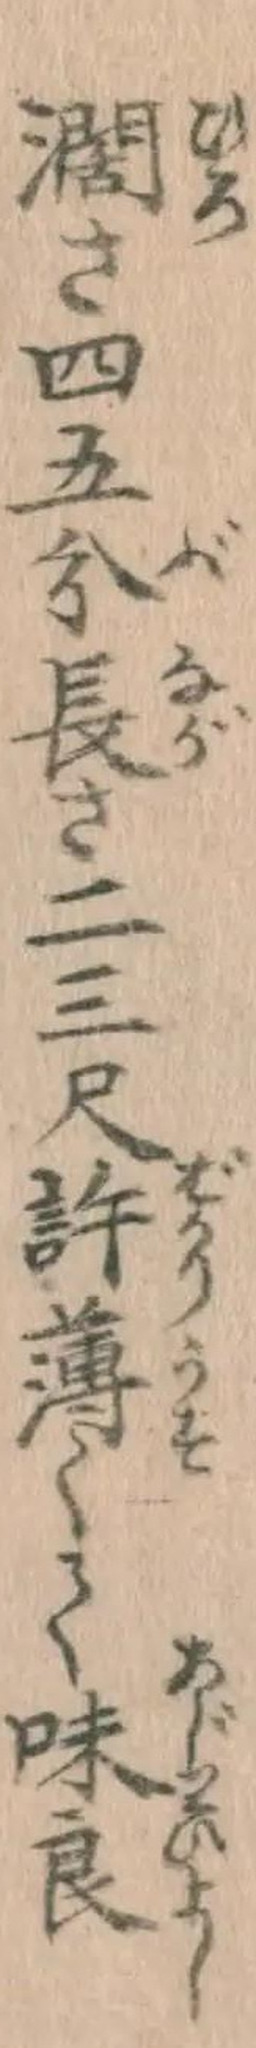闊さ四五分長さ二三尺許薄くて味良

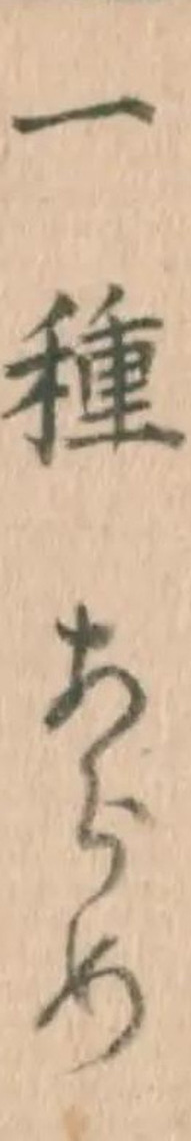一種あらめ
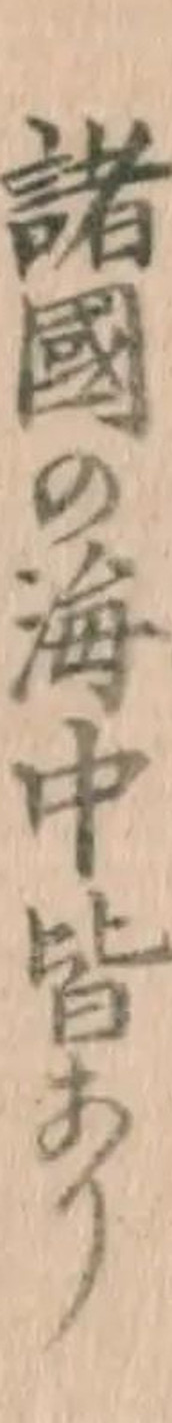諸国の海中皆あり
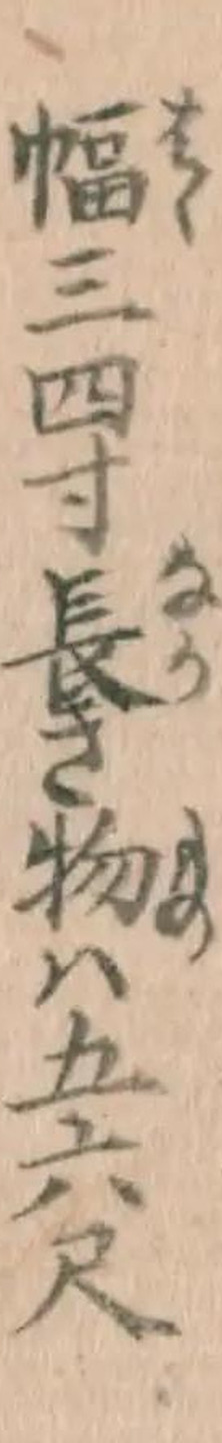幅三四寸長き物は五六尺
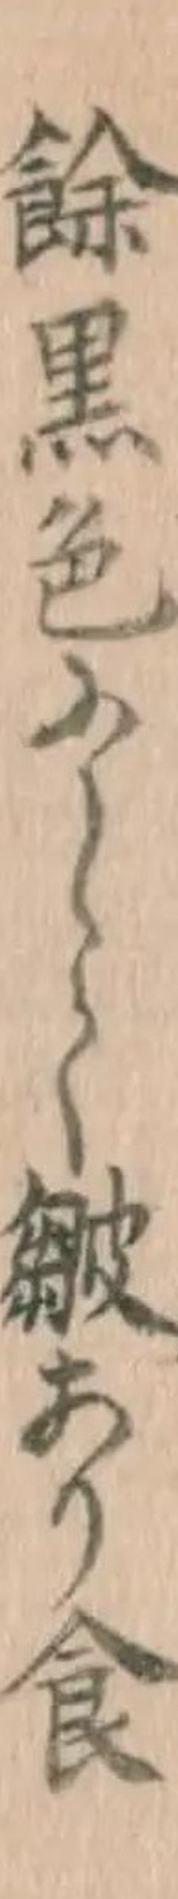余黒色にして皺あり食

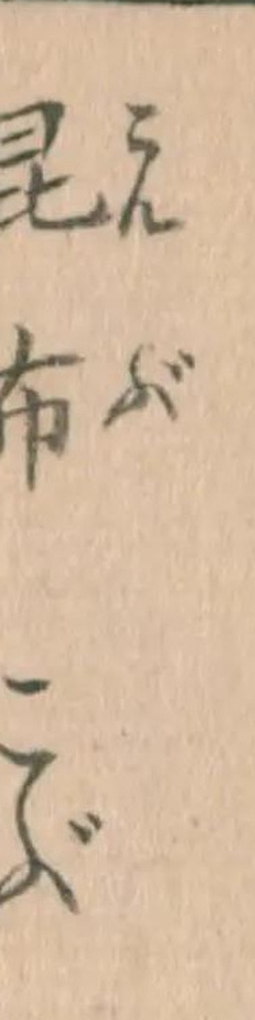昆布こぶ
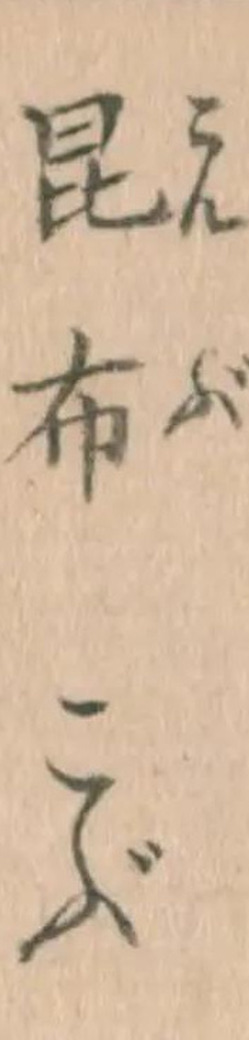昆布こぶ
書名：本草図譜. 巻34-36
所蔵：国立国会図書館 National Diet Library, JAPAN
